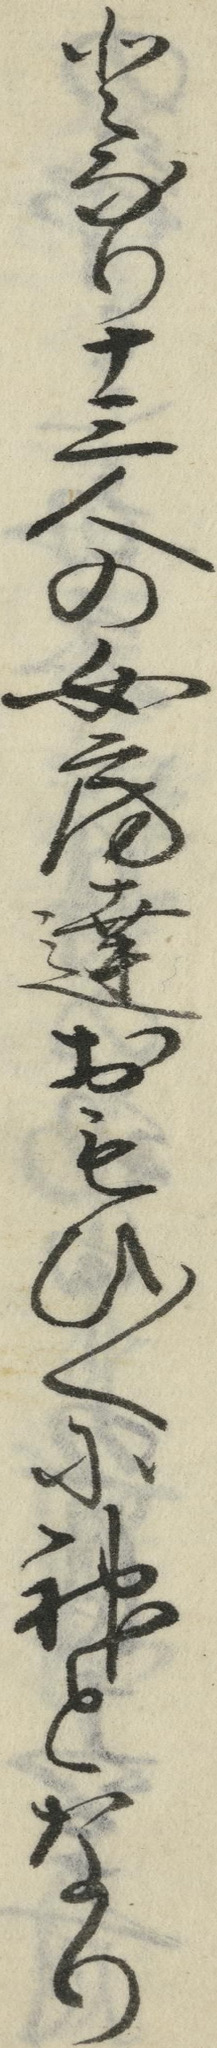となり十三人の女房達おもひ〳〵に神となり
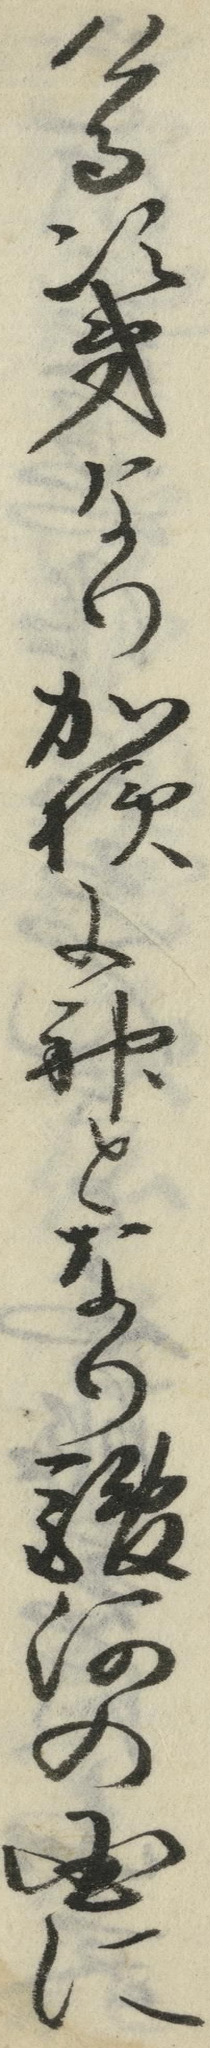ける次第なり加様に神となり駿河の国に
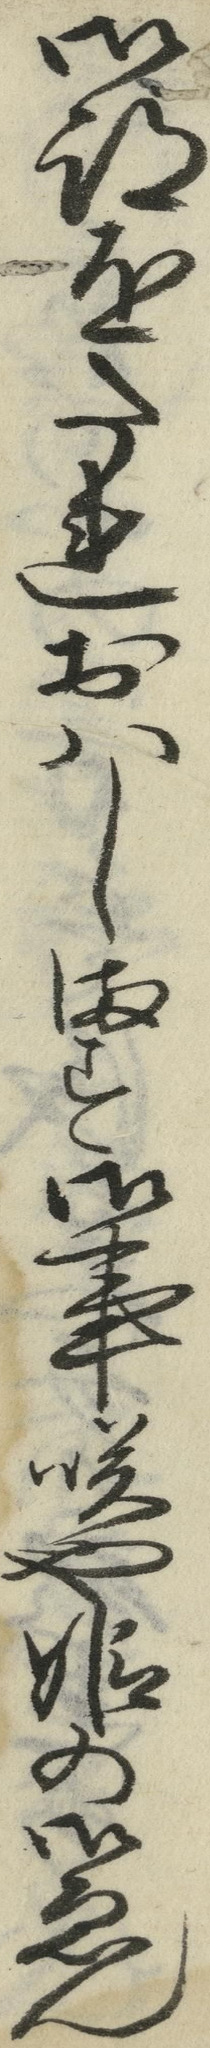御跡をたれおハします御事咲や姫の御ゑん
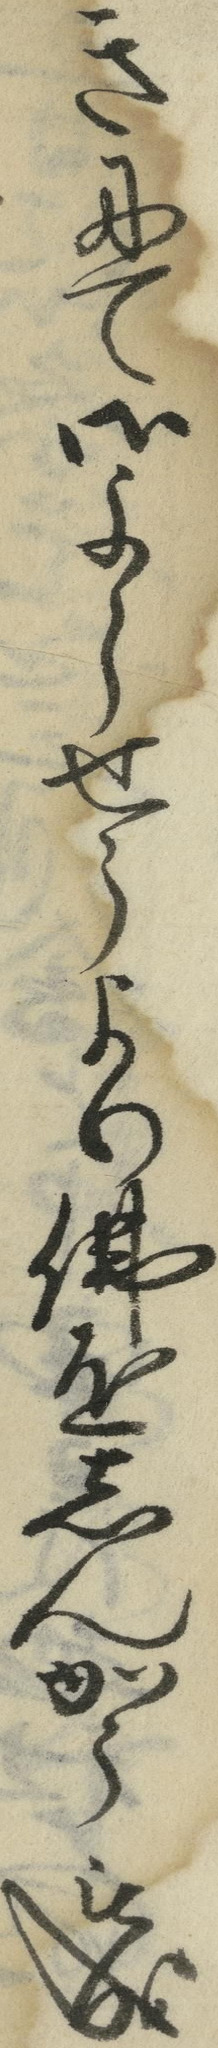きにて御ようせうより佛をしんかう被成
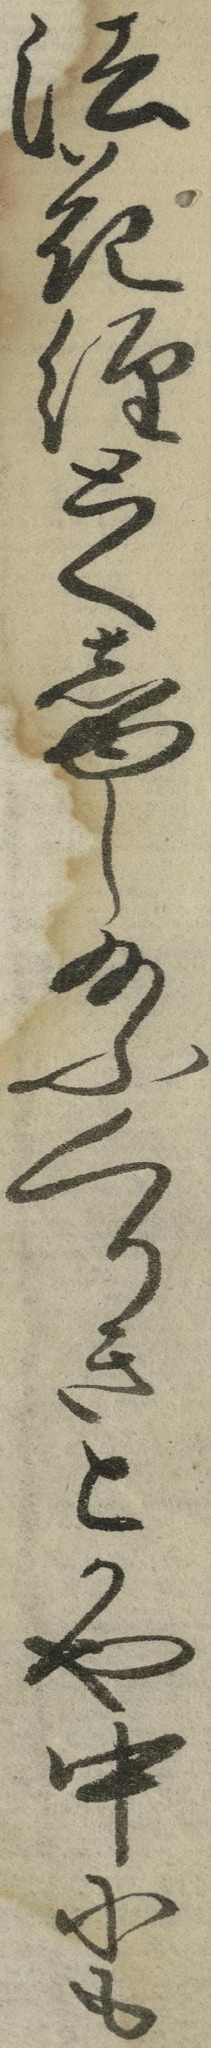法花経とくしゆし給ふくりきとかや中にも
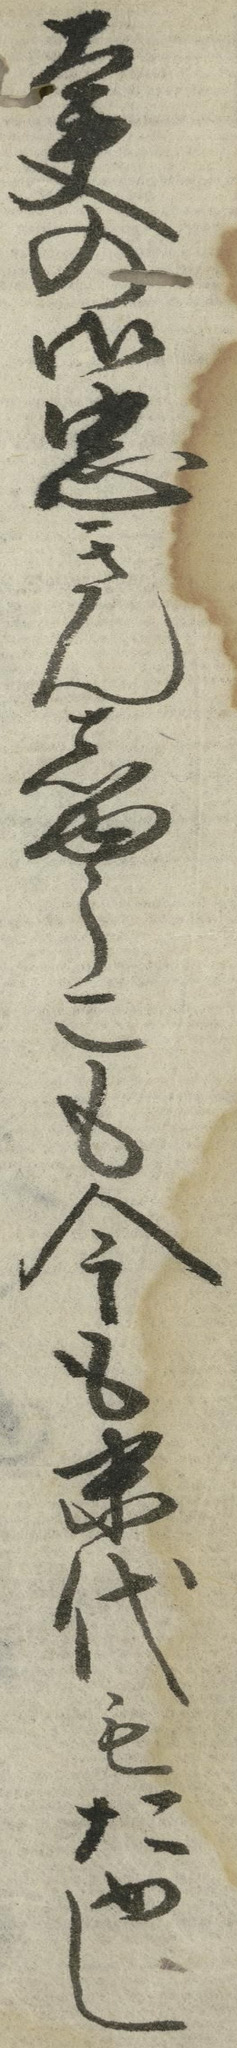太夫の御忠きんしやうこも今も末代もためし
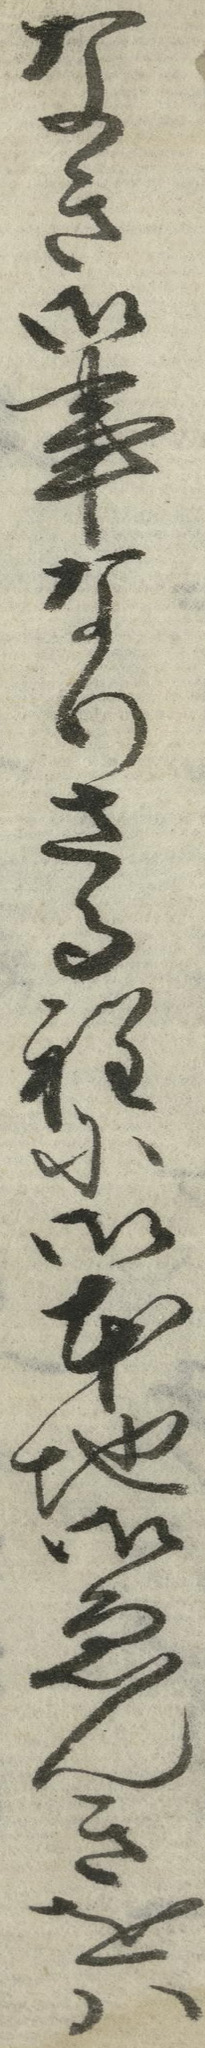なき御事なりさる程に御本地御ゑんきをハ
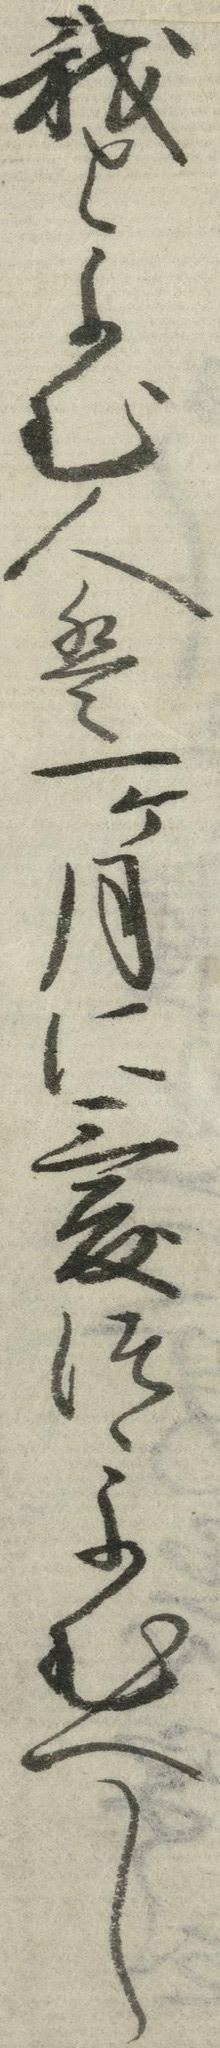我とよむ人は一ヶ月に三度つゝよむへし
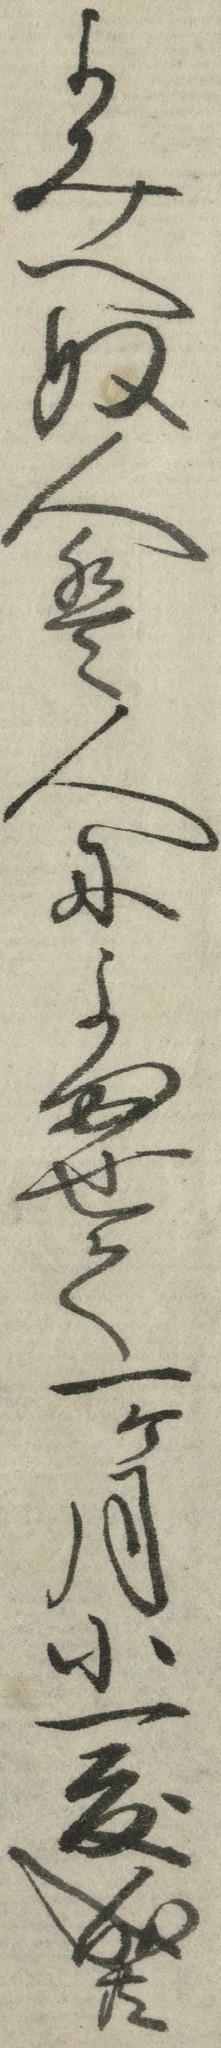よみへぬ人は人によませて一ヶ月に一度成共
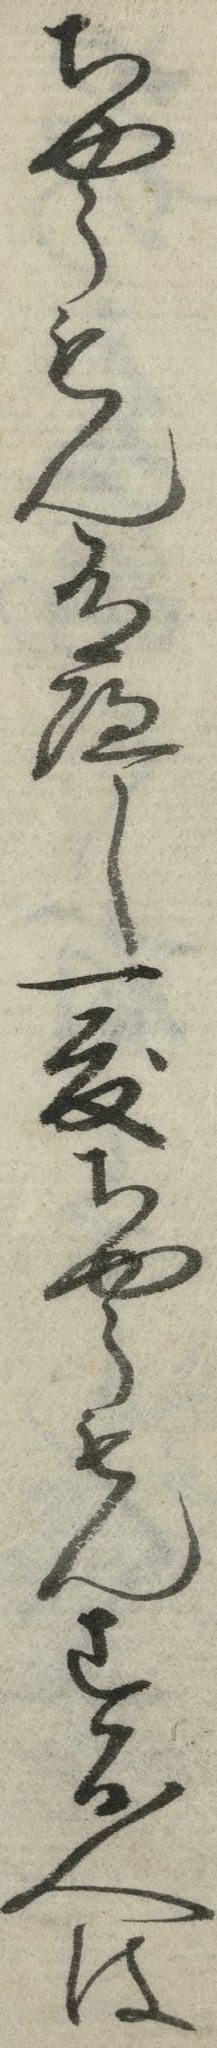ちやうもん有へし一度ちやうもんする人は
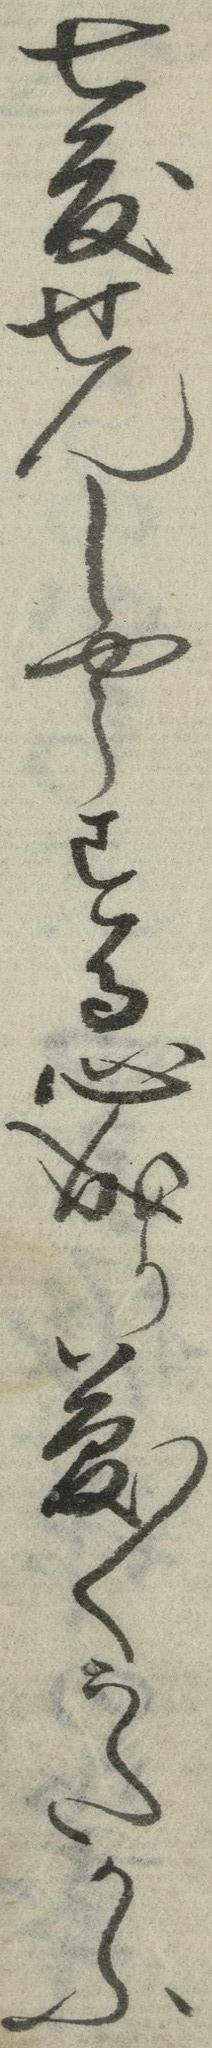七度せんしやうする心成リ夢〳〵うたかふ
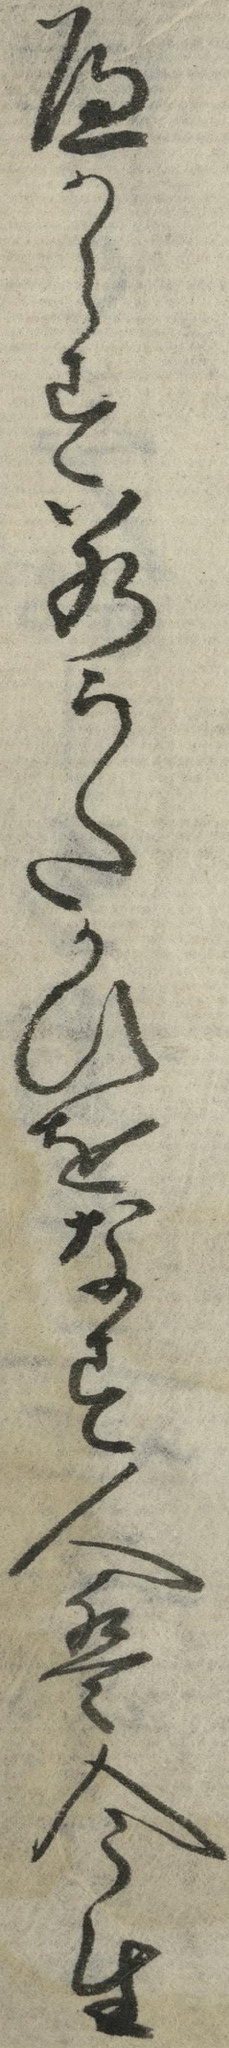やからす若うたかひをなす人は今生
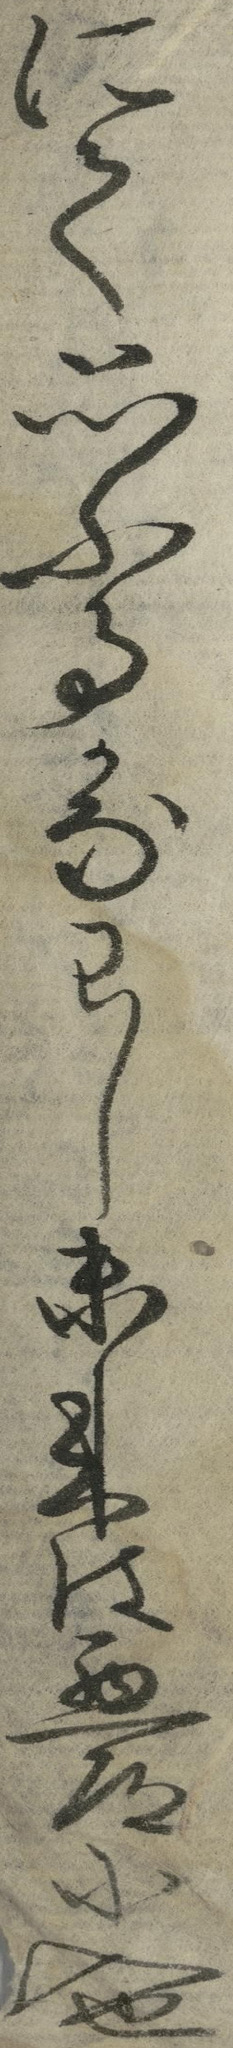にて思ふ事かなわし未来は悪道に入也

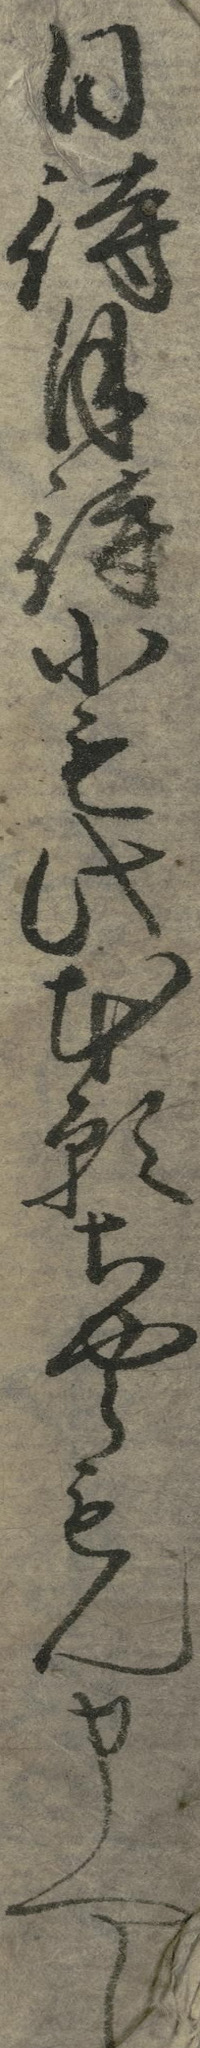日待月待にも此本願ちやうもん申へし
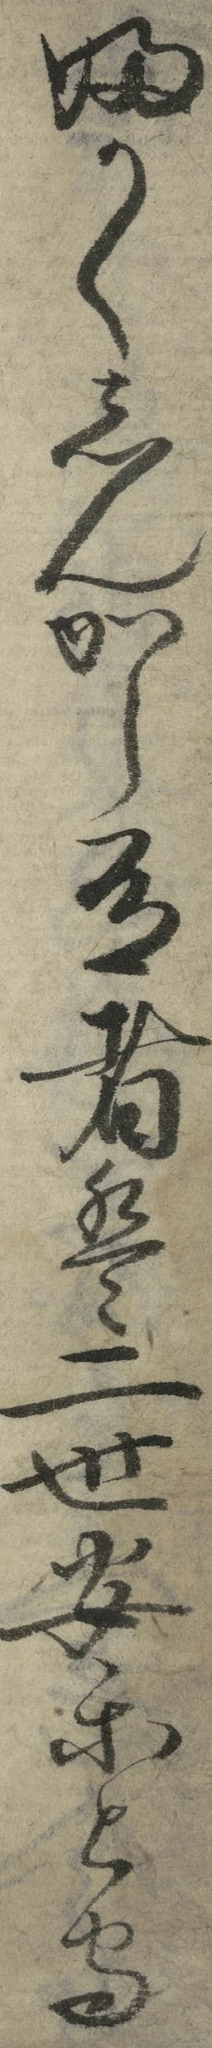ふかくしんかう有者は二世安楽と守
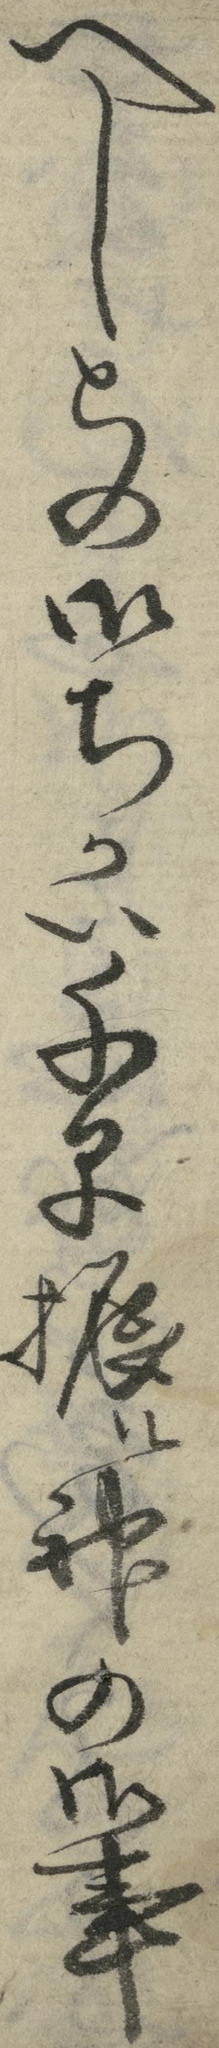へしとの御ちかい千早振ル神の御事
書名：浅間記
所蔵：東京大学地震研究所図書室 Earthquake Research Institute Library, The University of Tokyo, JAPAN
